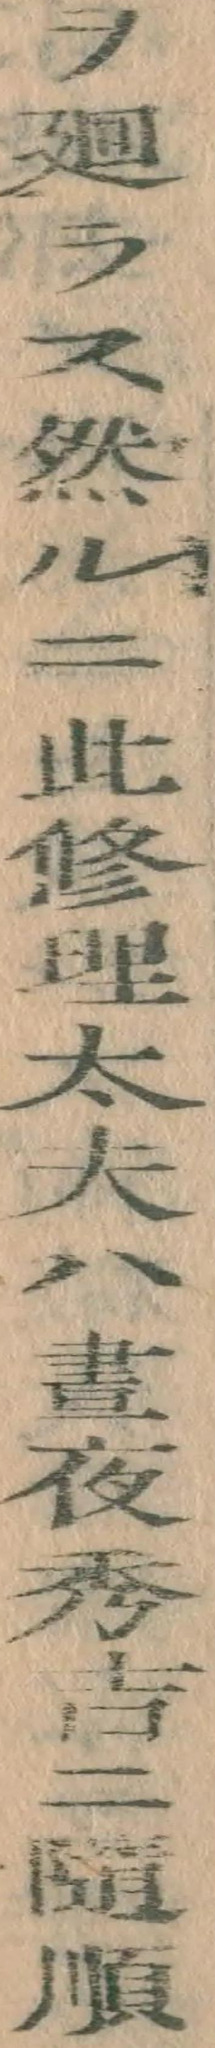ヲ廻ラス然ルニ此修理太夫ハ昼夜秀吉ニ随順
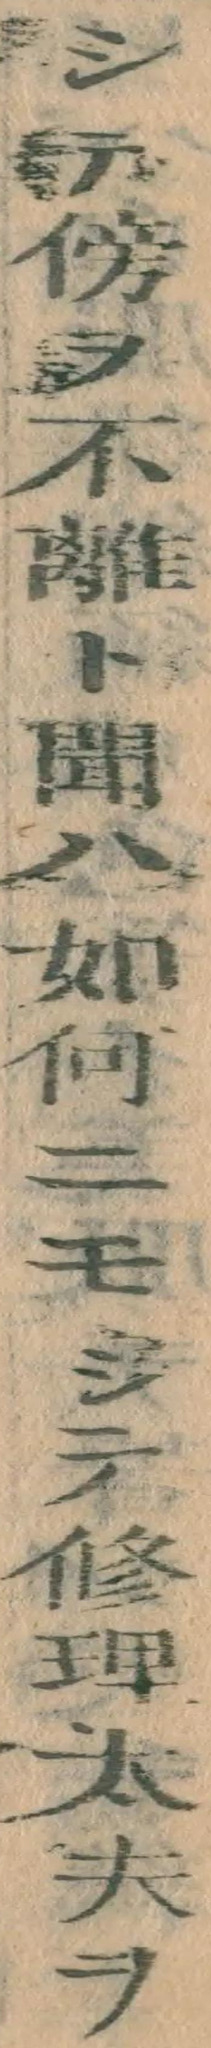シテ傍ヲ不離ト聞ハ如何ニモシテ修理太夫ヲ
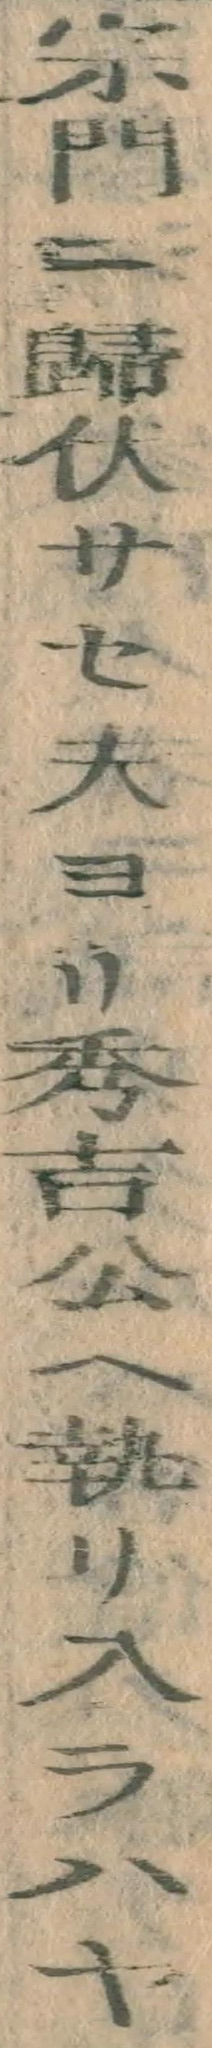宗門ニ帰伏サセ夫ヨリ秀吉公ヘ執リ入ラハヤ
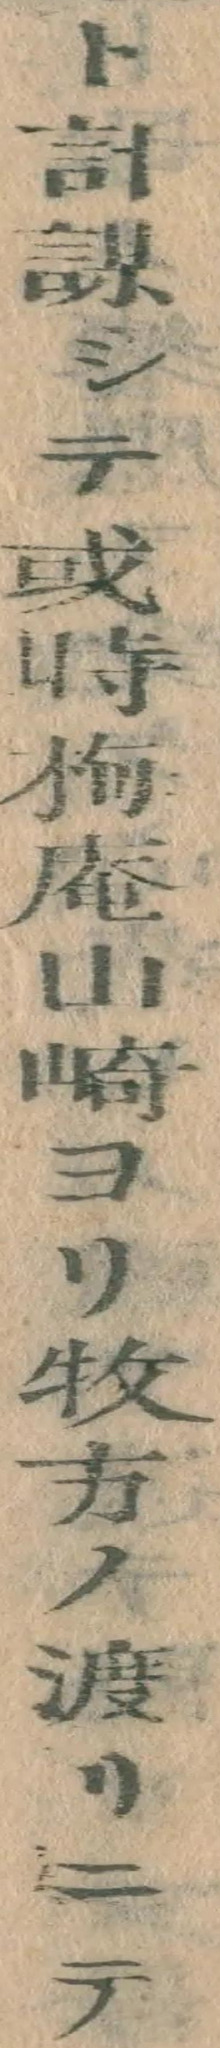ト計謀シテ或時梅庵山崎ヨリ牧方ノ渡リニテ
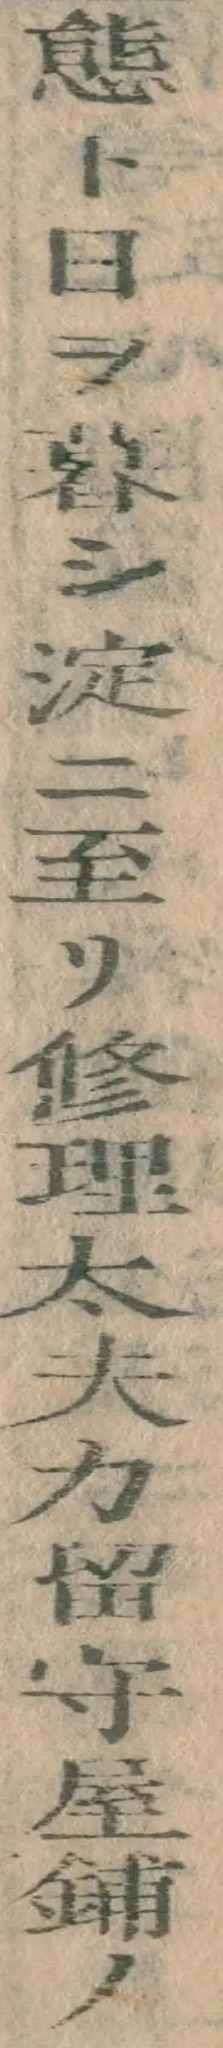態ト日ヲ暮シ淀ニ至リ修理太夫カ留守屋鋪ノ
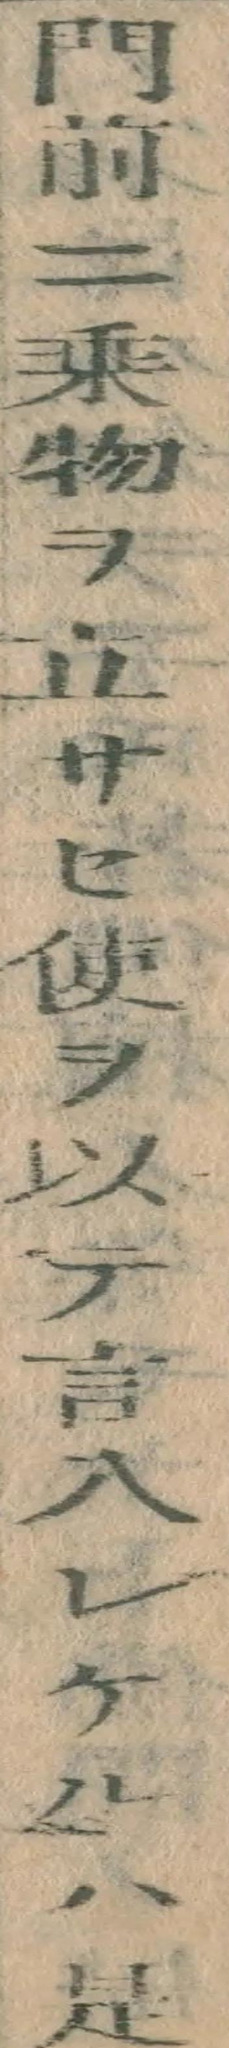門前ニ乗物ヲ立サセ使ヲ以テ言入レケルハ是
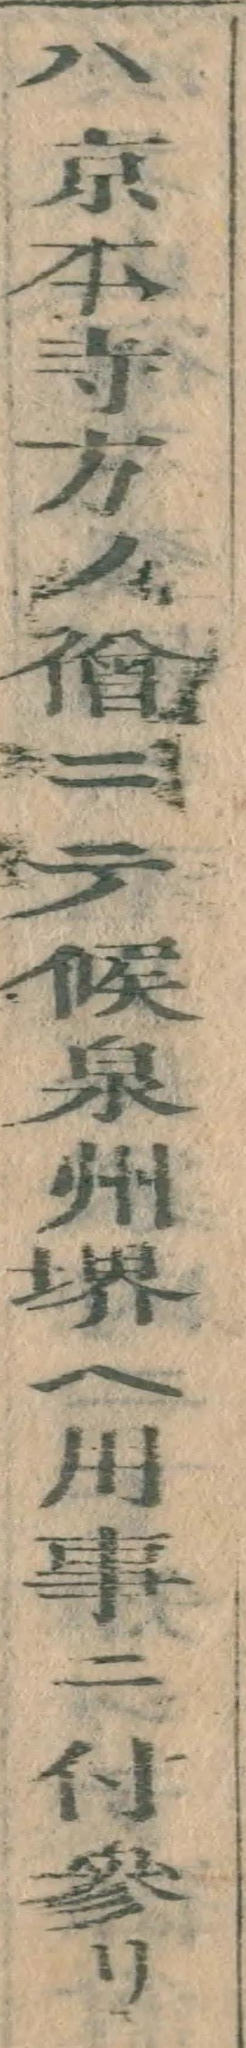ハ京本寺方ノ僧ニテ候泉州堺ヘ用事ニ付参リ
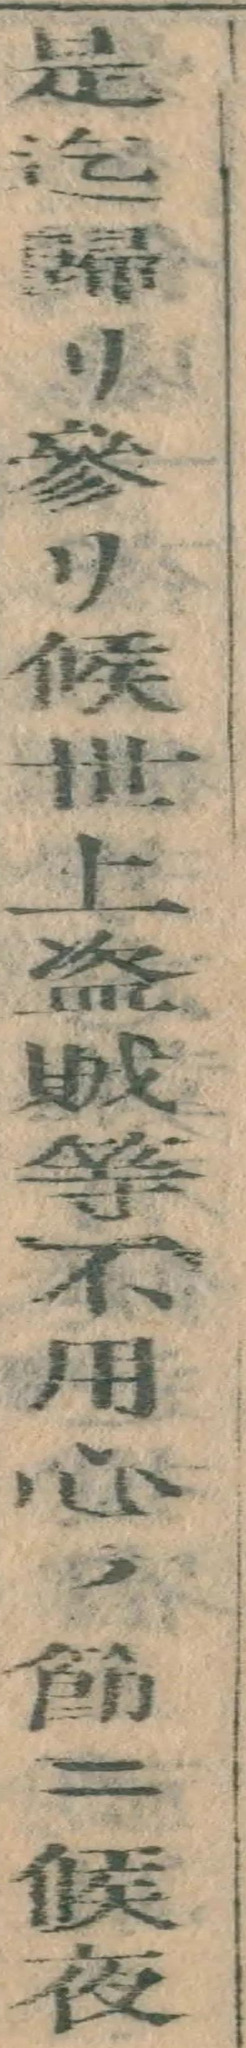是迄帰リ参リ候世上盗賊等不用心ノ節ニ候夜
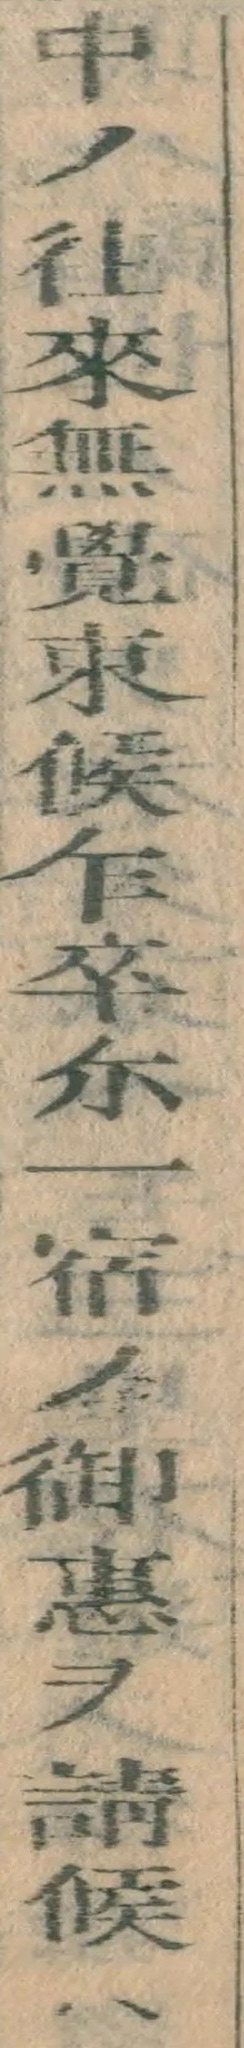中ノ往来無覚束候乍卒爾一宿ノ御恵ヲ請候ハ
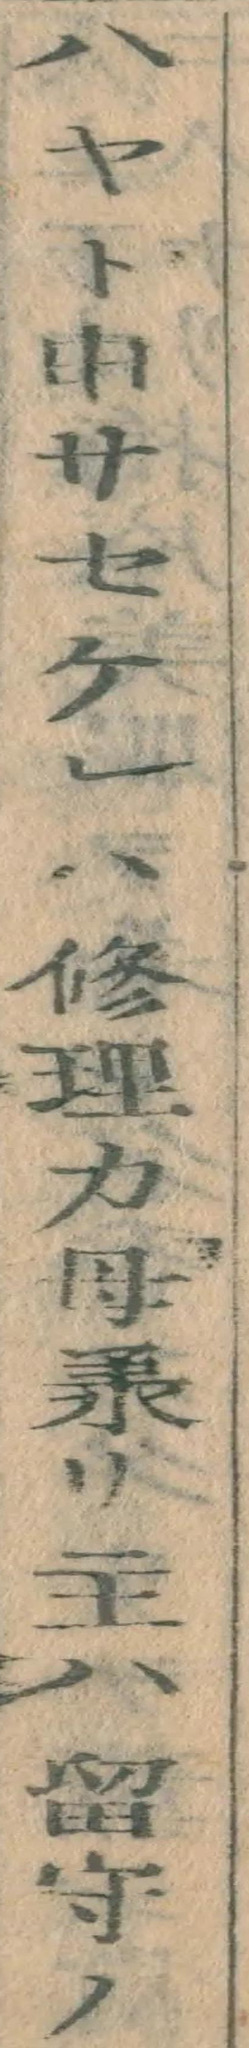ハヤト申サセケレハ修理カ母承リ主ハ留守ノ
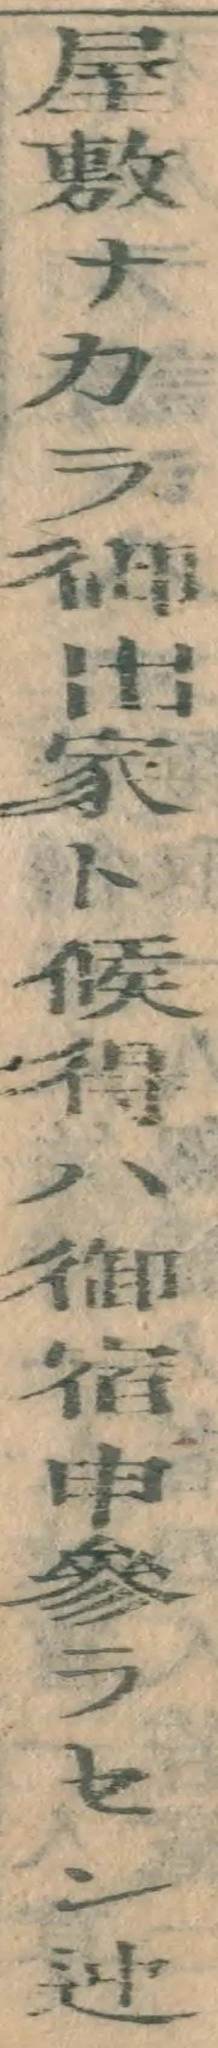屋敷ナカラ御出家ト候得ハ御宿申参ラセン迚

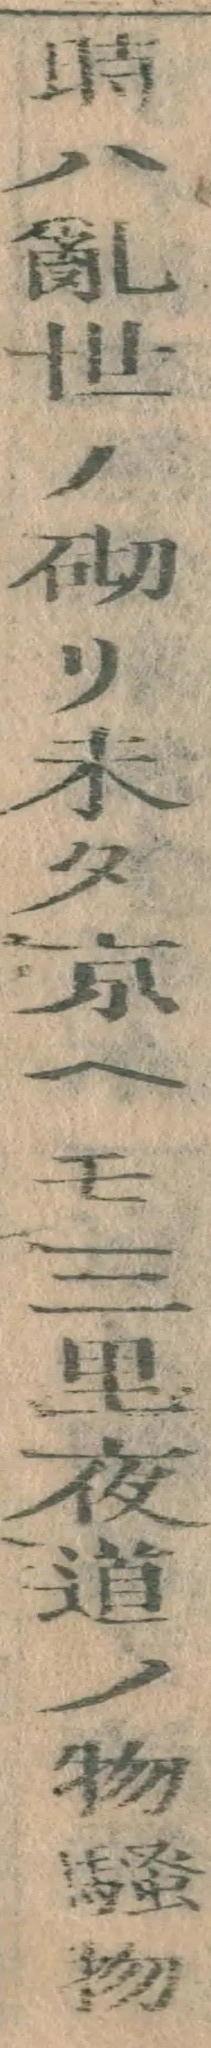時ハ乱世ノ砌リ未タ京ヘモ三里夜道ノ物騒物
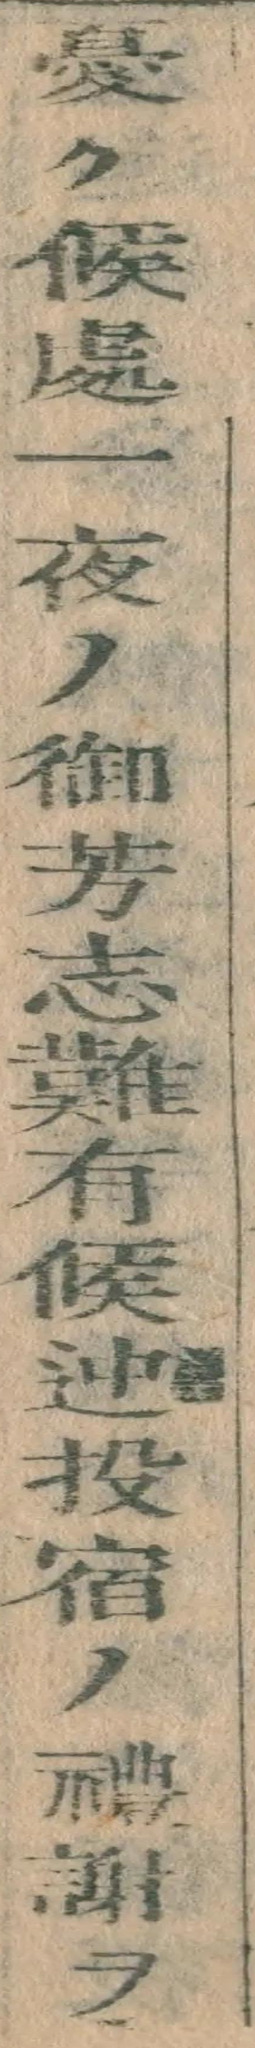憂ク候処一夜ノ御芳志難有候迚投宿ノ礼謝ヲ
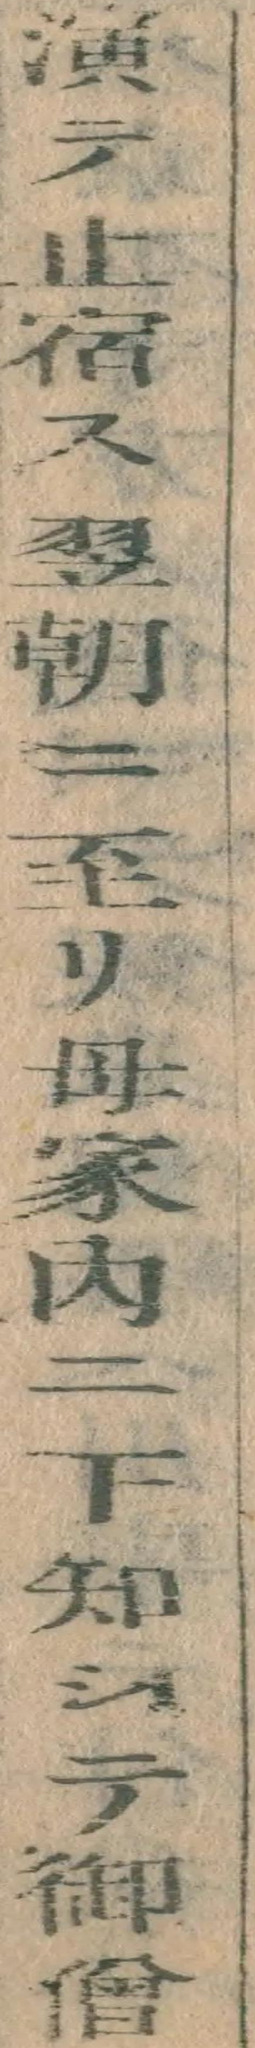演テ止宿ス翌朝ニ至リ母家内ニ下知シテ御僧
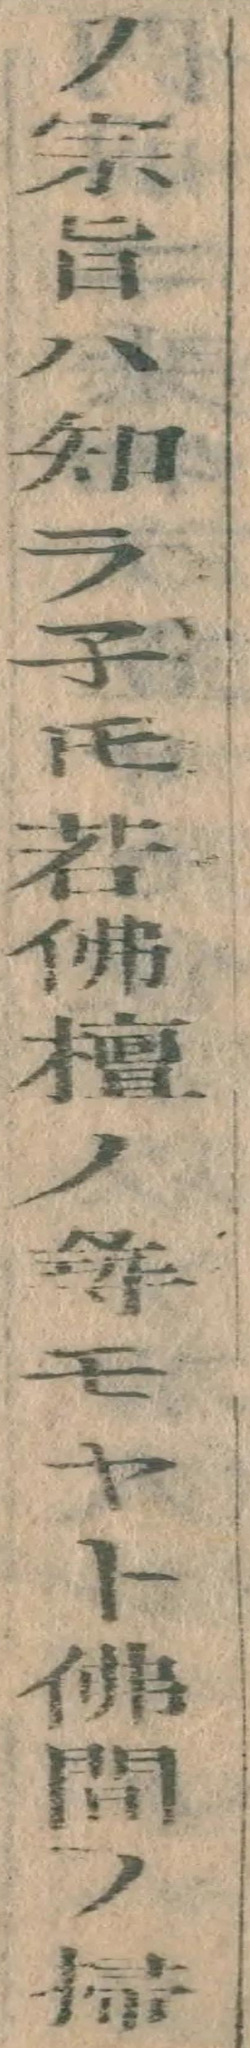ノ宗旨ハ知ラネトモ若仏檀ノ尋モヤト仏間ノ掃
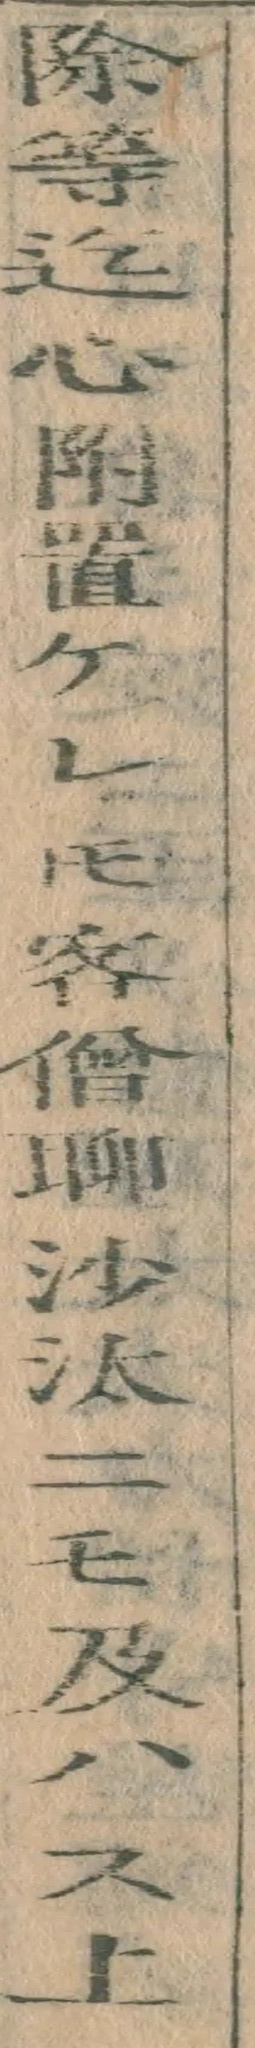除等迄心附置ケレトモ客僧聊沙汰ニモ及ハス上
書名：南蛮寺興廃記
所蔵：国立国会図書館 National Diet Library, JAPAN
